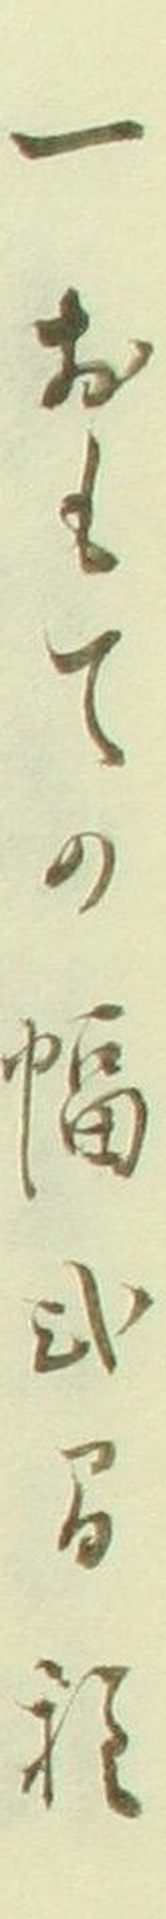一おもての幅弐間程
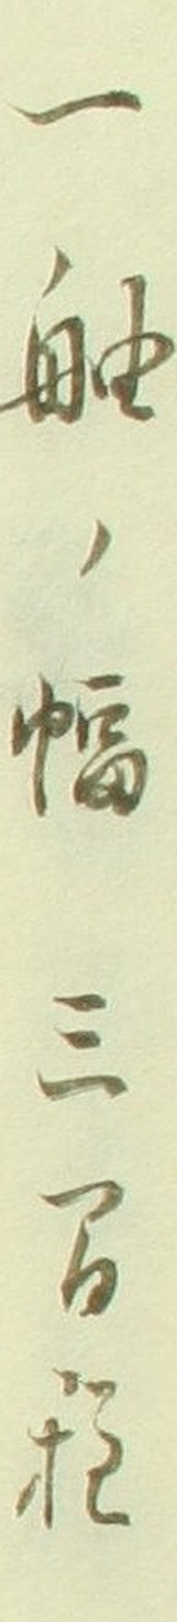一舳ノ幅三間程
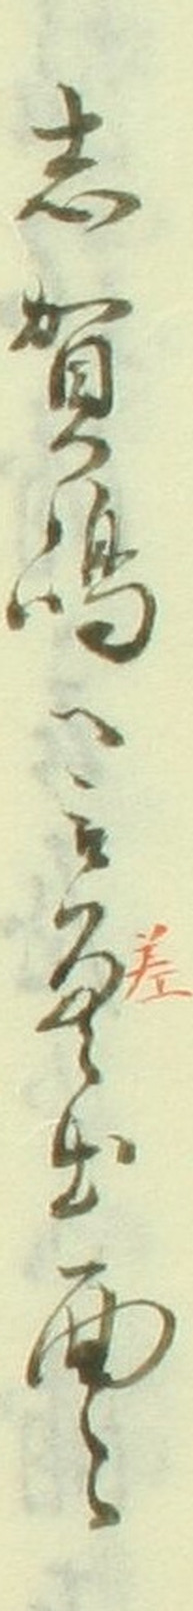志賀嶋へ被差出面々
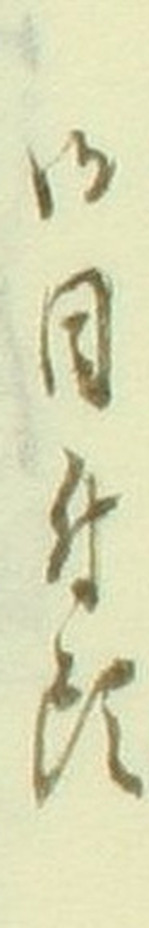御目付頭
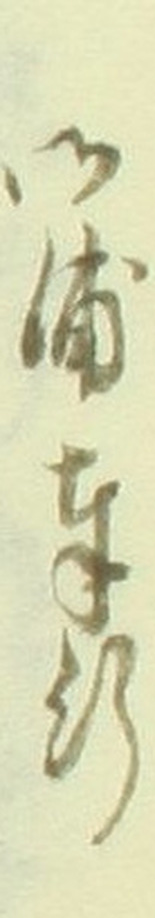御浦奉行
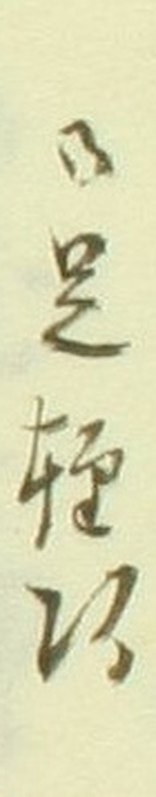御足軽頭
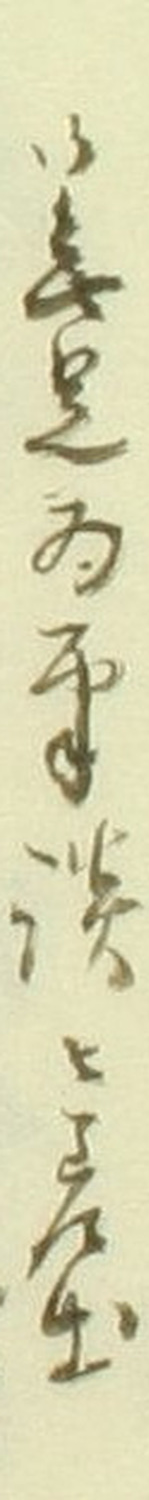御義足為平談被差出
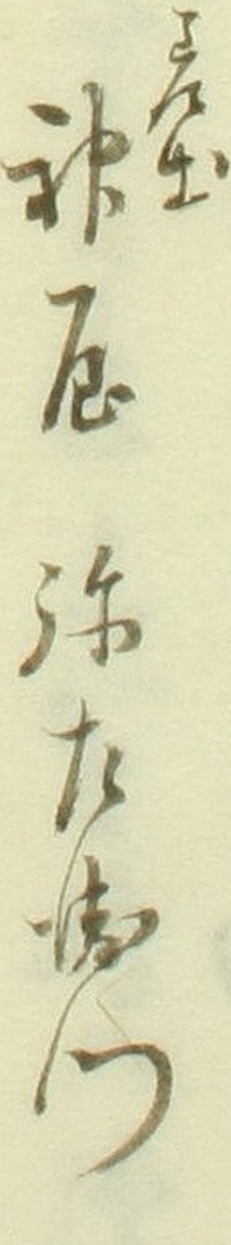同神屋弥左衛門
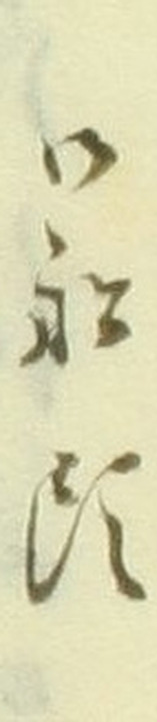御船頭
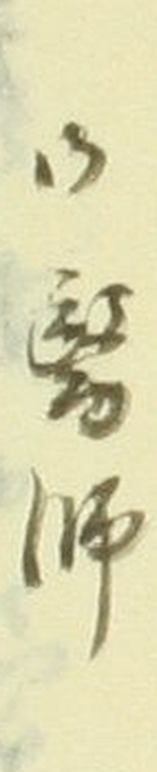御医師
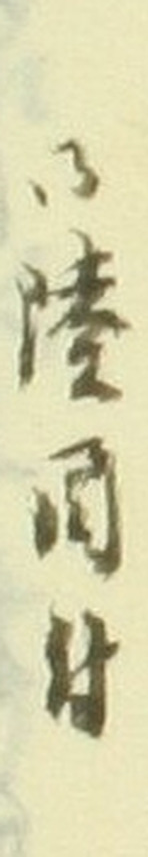御陸目付
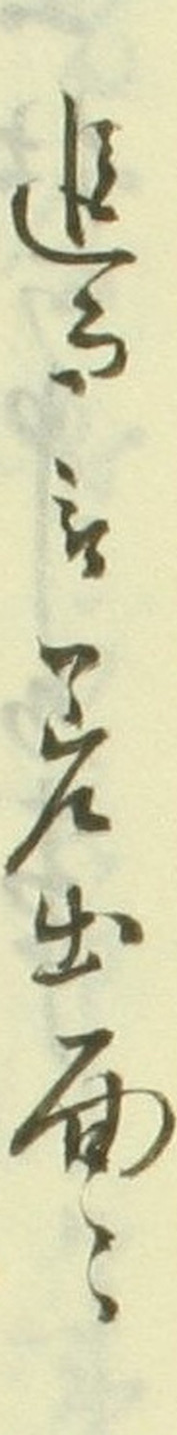追而被差出面々
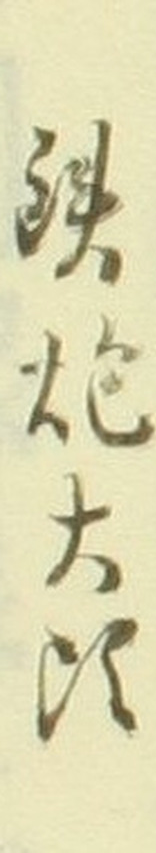鉄炮大頭
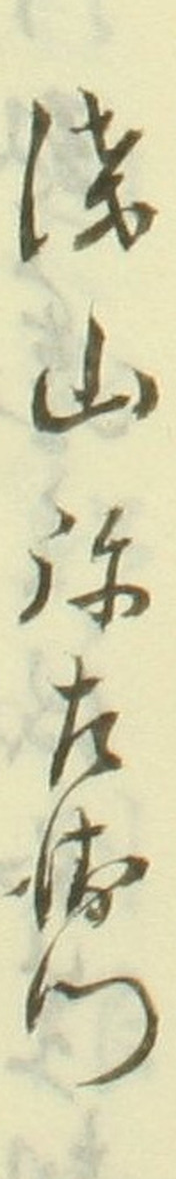浅山弥左衛門
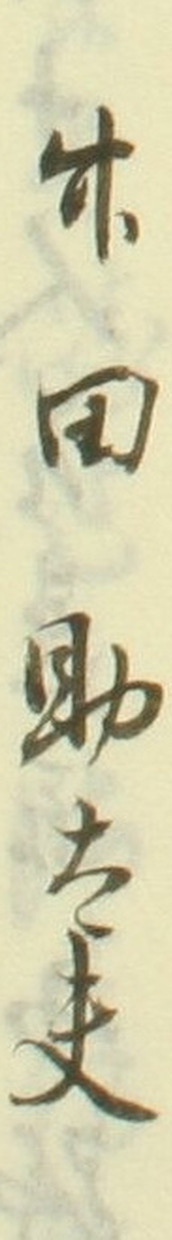竹田助太夫
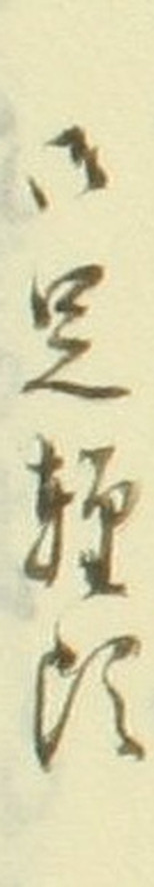御足軽頭
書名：異国船漂着記
